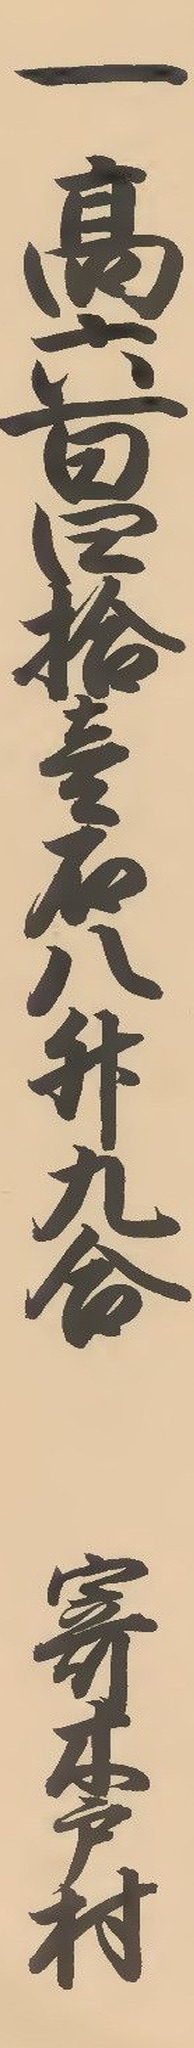一髙六百四拾壱石八升九合寄木戸村
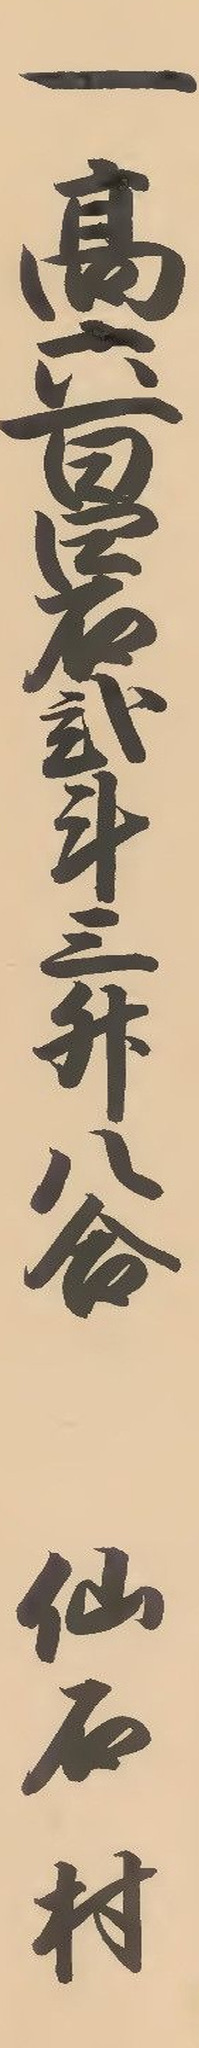一髙六百四石弐斗三升八合仙石村

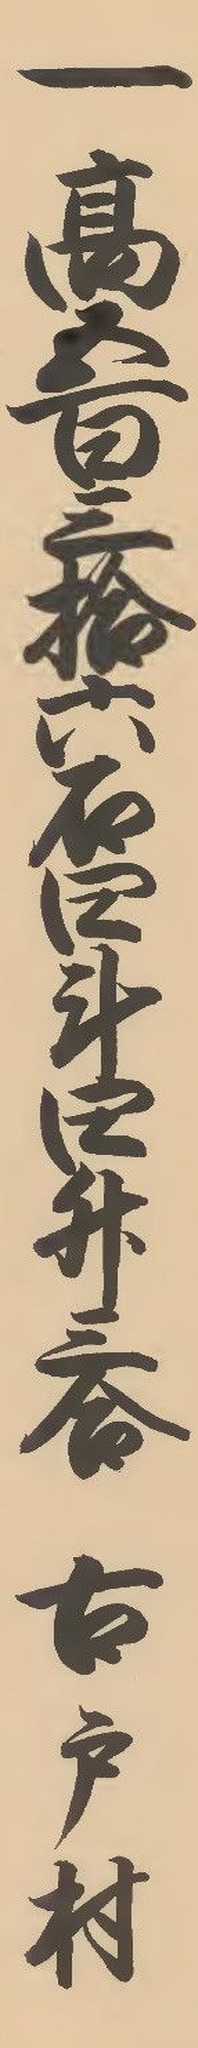一髙五百三拾六石四斗四升三合古戸村
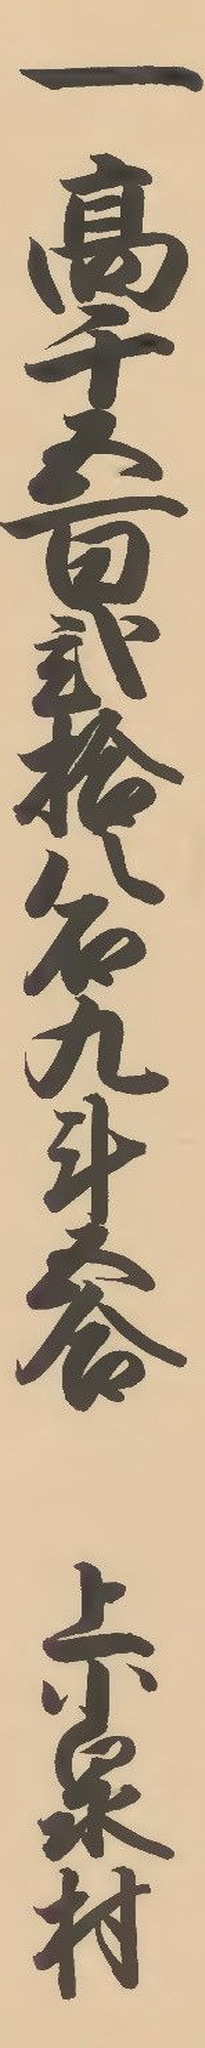一髙千五百弐拾八石九斗五合上小泉村
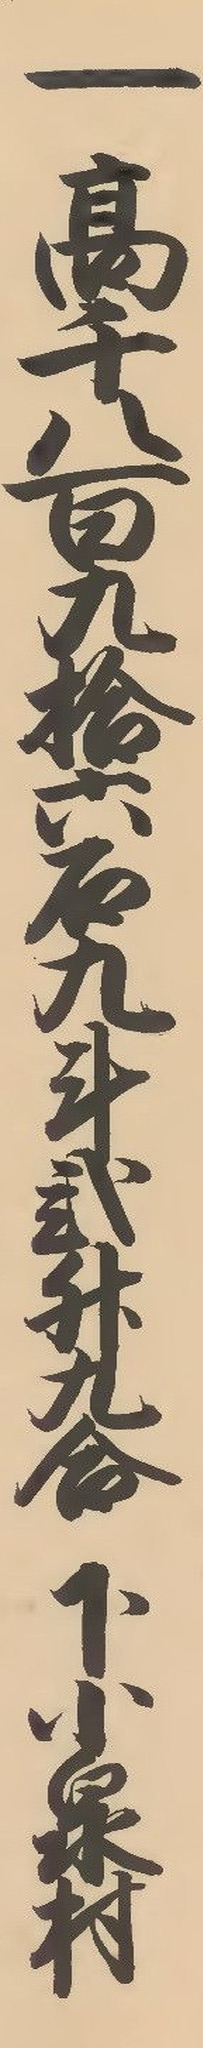一髙千八百九拾六石九斗弐升九合下小泉村
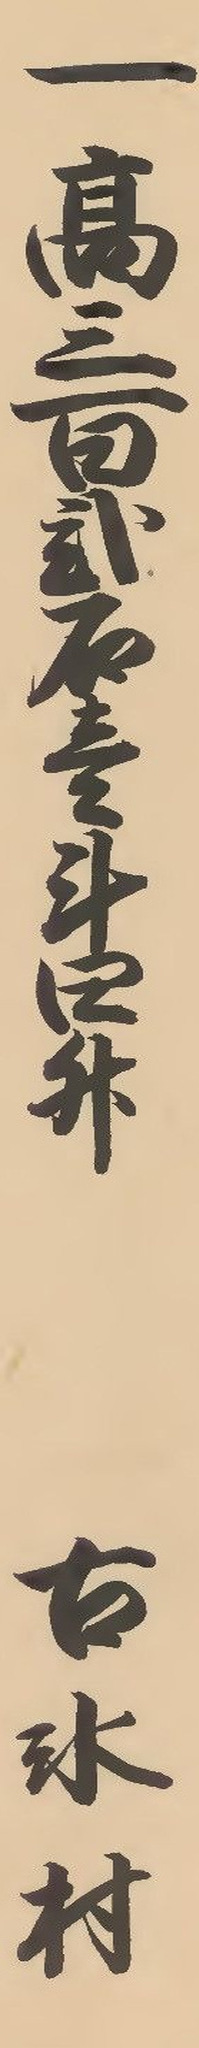一髙三百弐石壱斗四升古水村
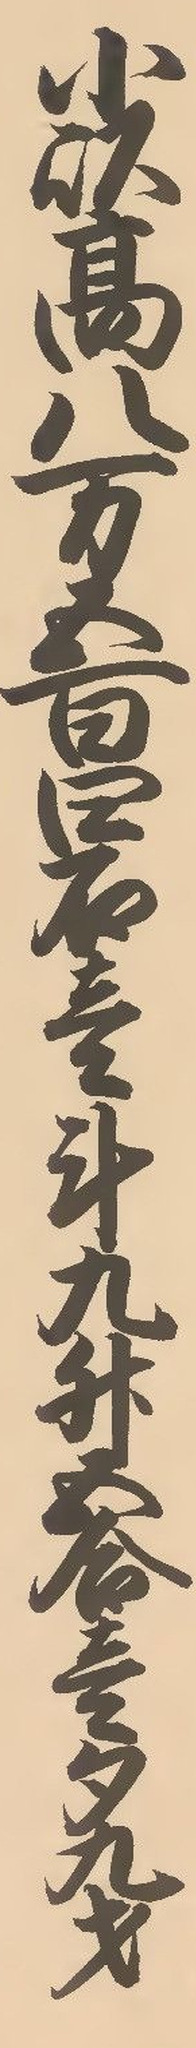小以髙八万五百四石壱斗九升五合壱夕九才

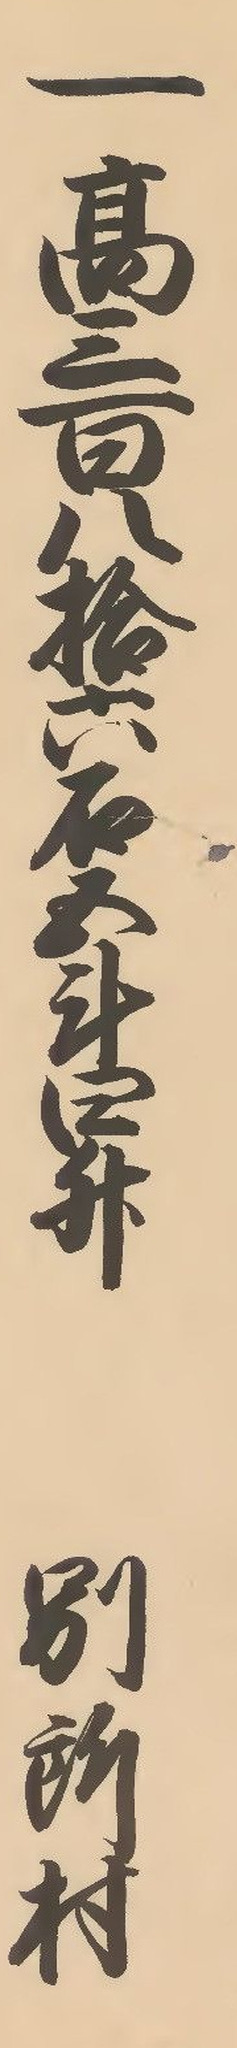一髙三百八拾六石五斗四升別所村
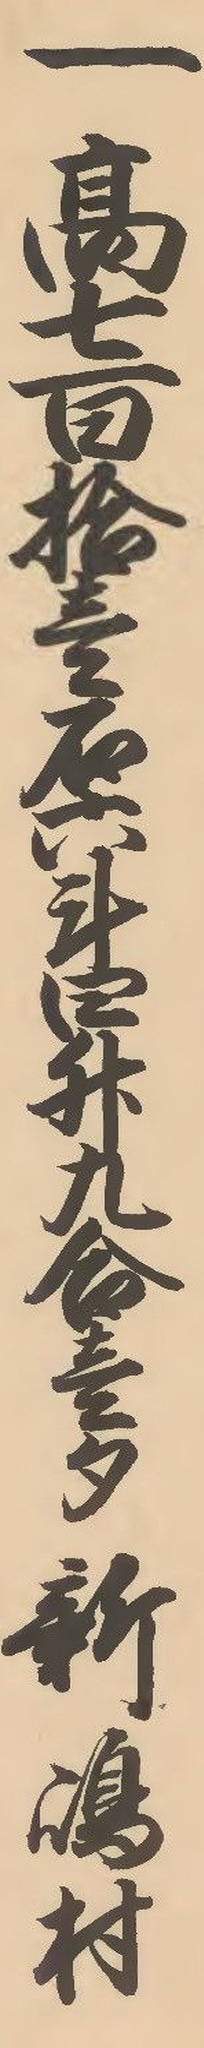一髙七百拾壱石六斗四升九合壱夕新嶋村
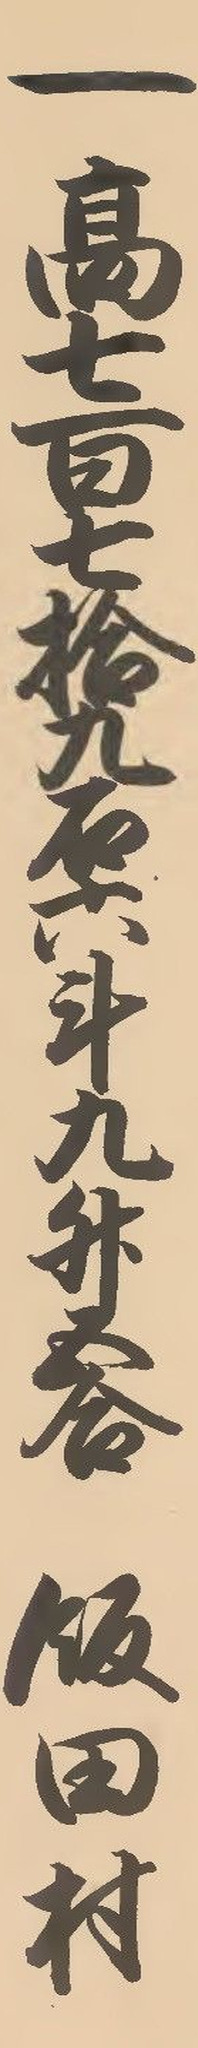一髙七百七拾九石六斗九升五合飯田村
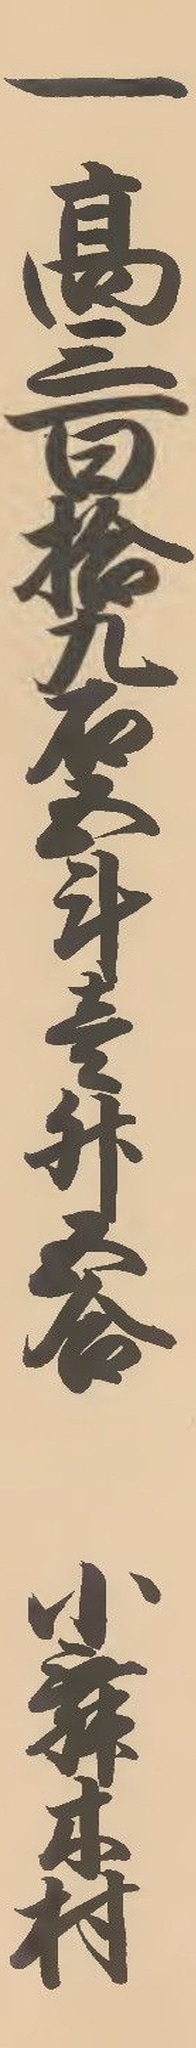一髙三百拾九石五斗壱升五合小舞木村
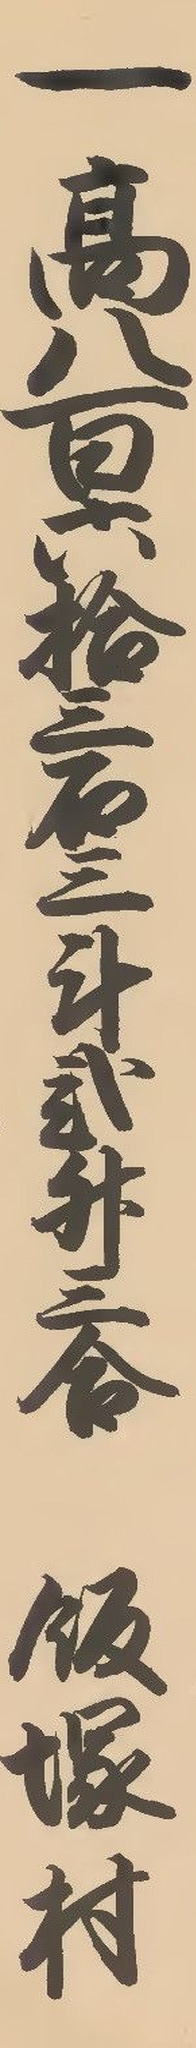一髙八百六拾三石三斗弐升三合飯塚村
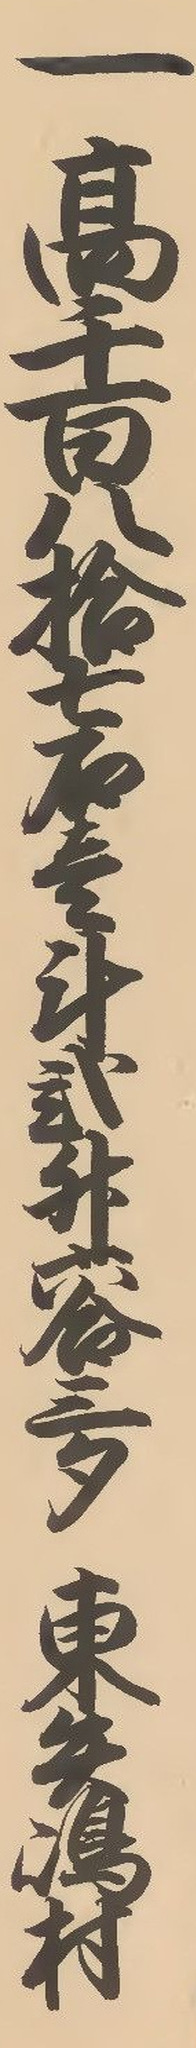一髙千百八拾七石壱斗弐升六合三夕東矢嶋村

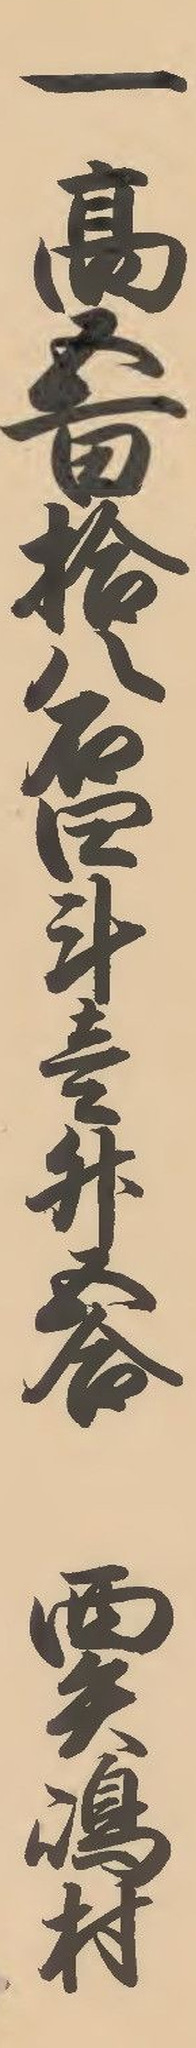一髙五百拾八石四斗壱升五合西矢嶋村
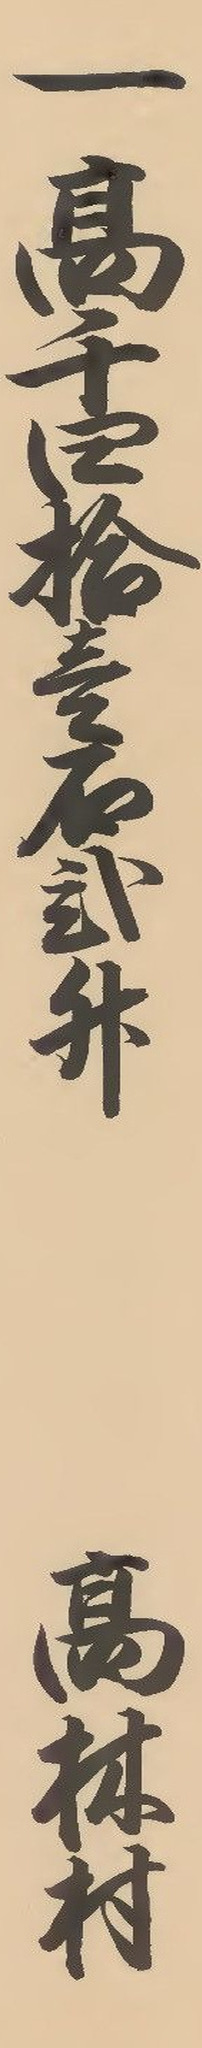一髙千四拾壱石弐升髙林村
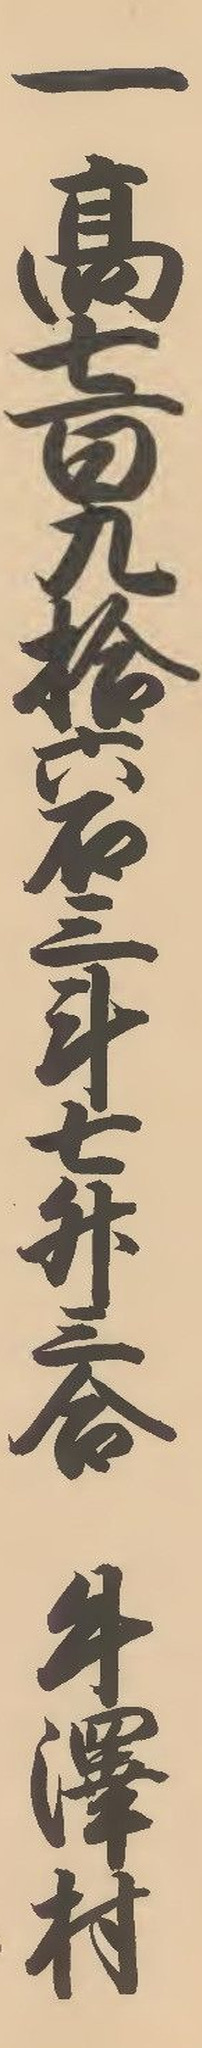一髙七百九拾六石三斗七升三合牛澤村
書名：上野国郷帳
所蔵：国立公文書館 National Archives of Japan
